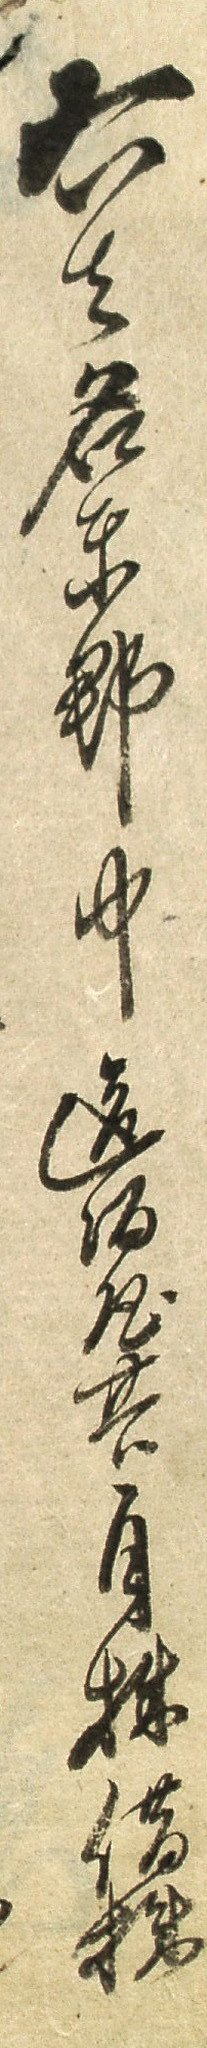右は名東郡中造酒屋其自株借株
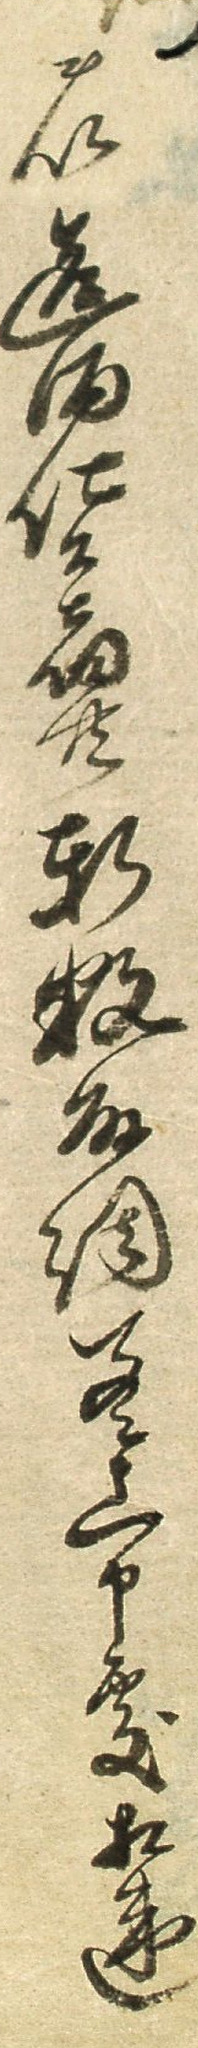を以造酒仕候者共軒数取調差上申処相違
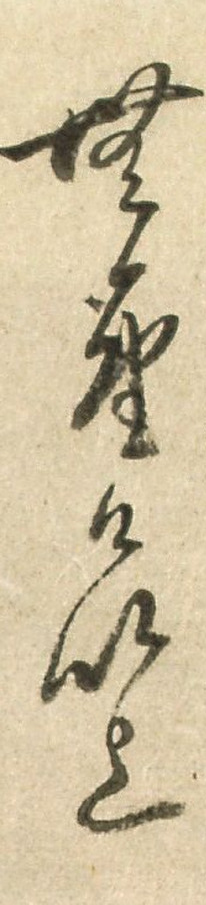無御座候以上
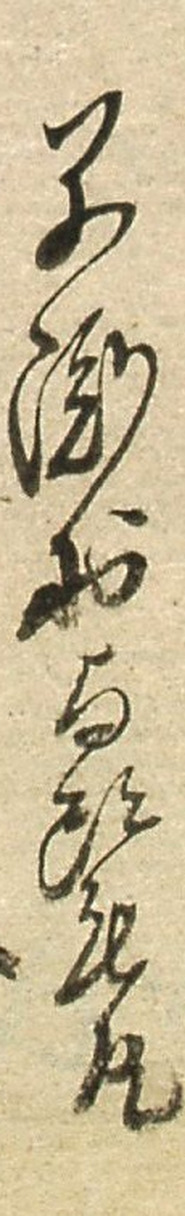早淵村与頭庄屋
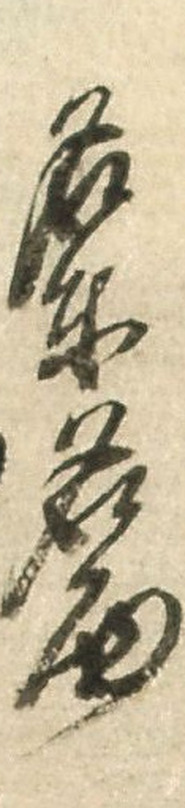名東名西
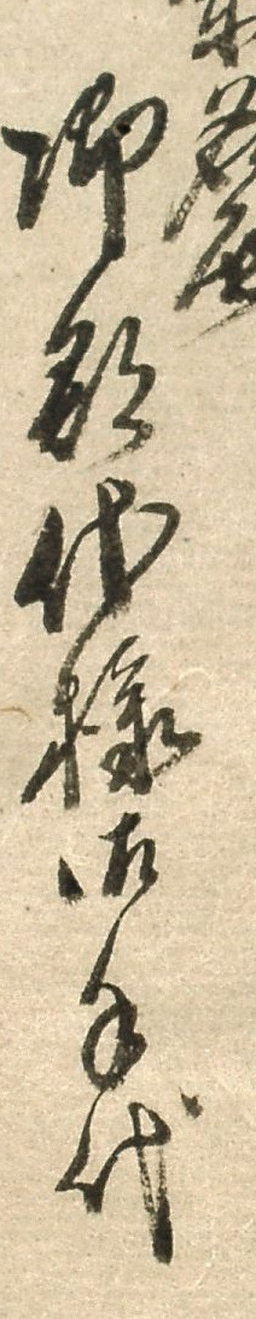御郡代様御手代
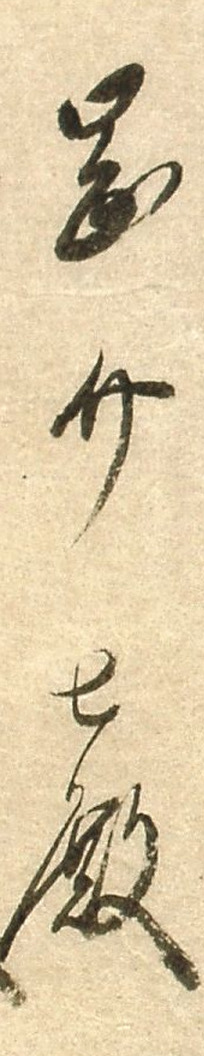岡介七殿
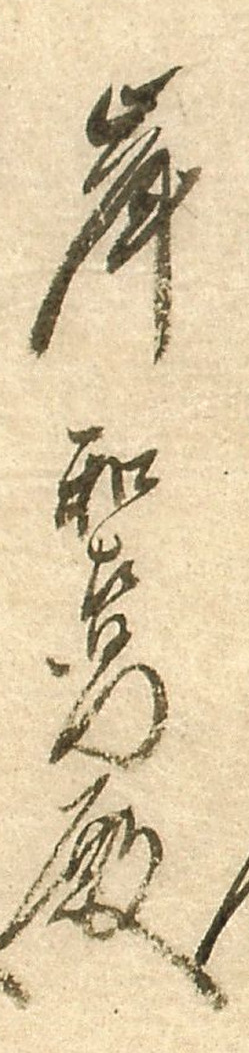岸和左衛門殿
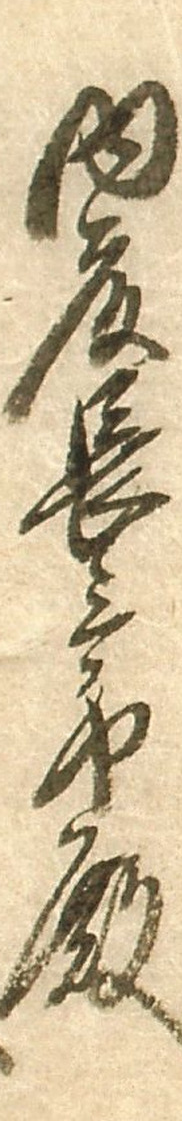内藤長三郎殿
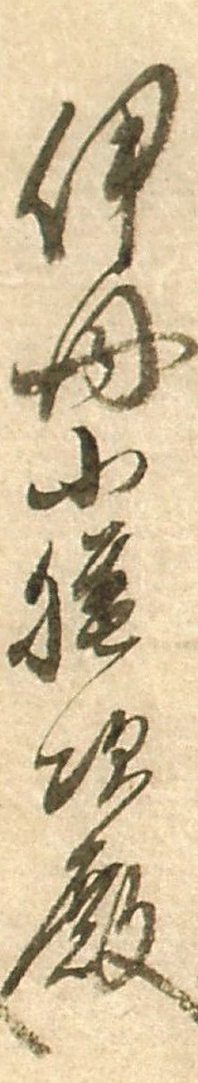伊丹小次殿
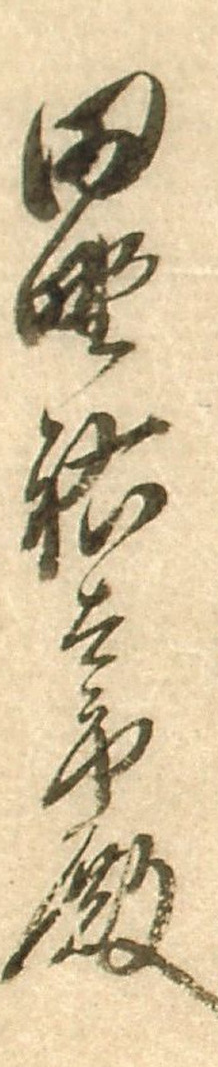田野裕太郎殿
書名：名東郡中酒株並造酒屋軒数取調帳
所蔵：鳴門教育大学 Naruto University of Education
